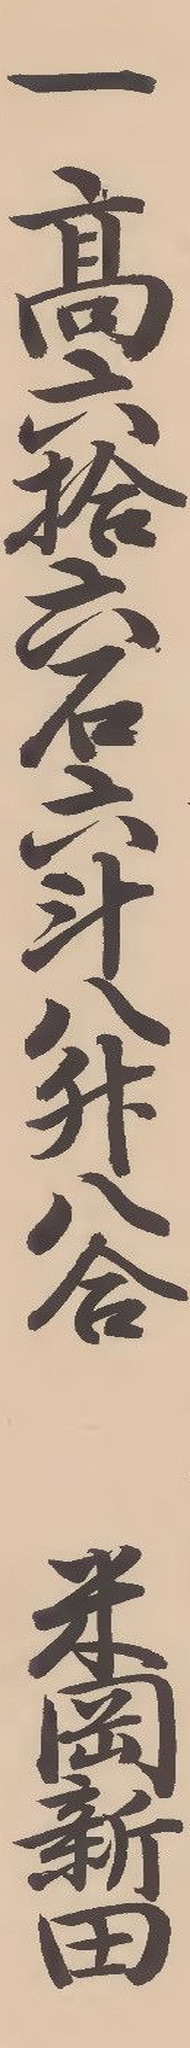一高六拾六石六斗八升八合米岡新田
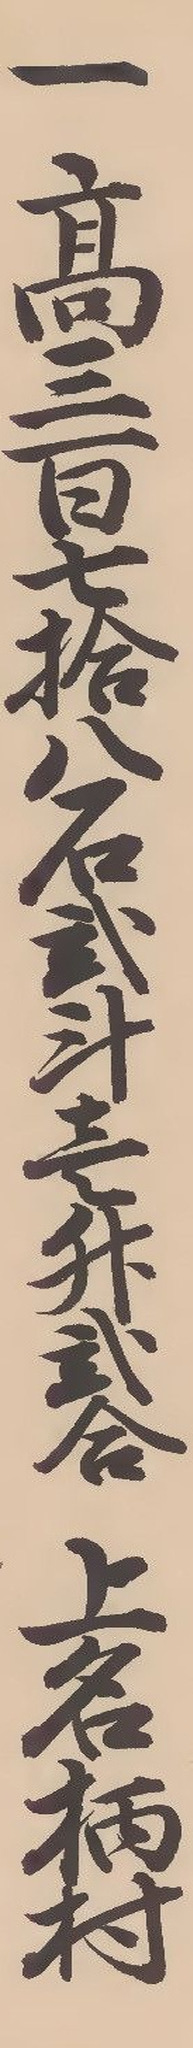一高三百七拾八石弐斗壱升弐合上名柄村

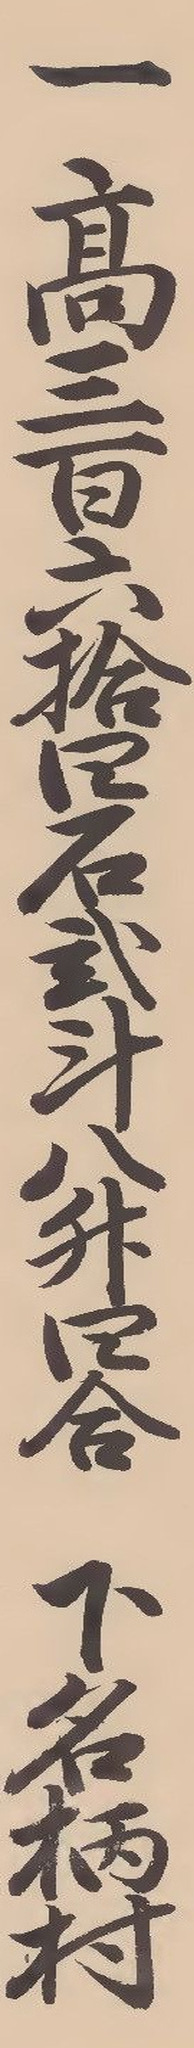一高三百六拾四石弐斗八升四合下名柄村
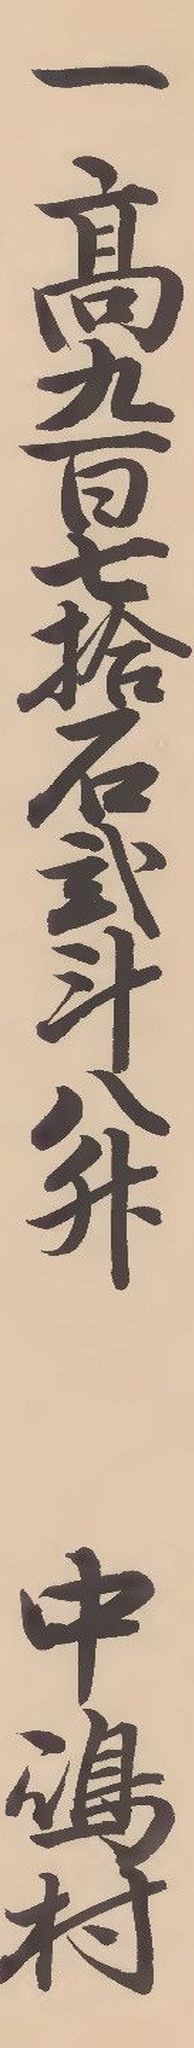一高九百七拾石弐斗八升中島村
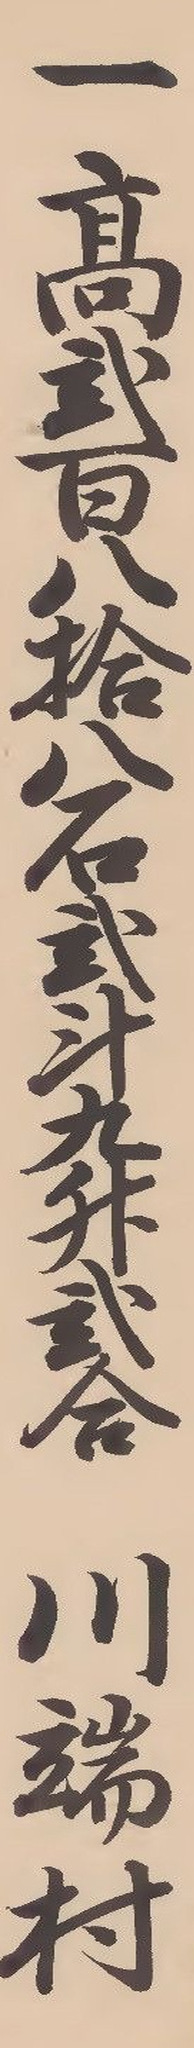一高弐百八拾八石弐斗九升弐合川端村
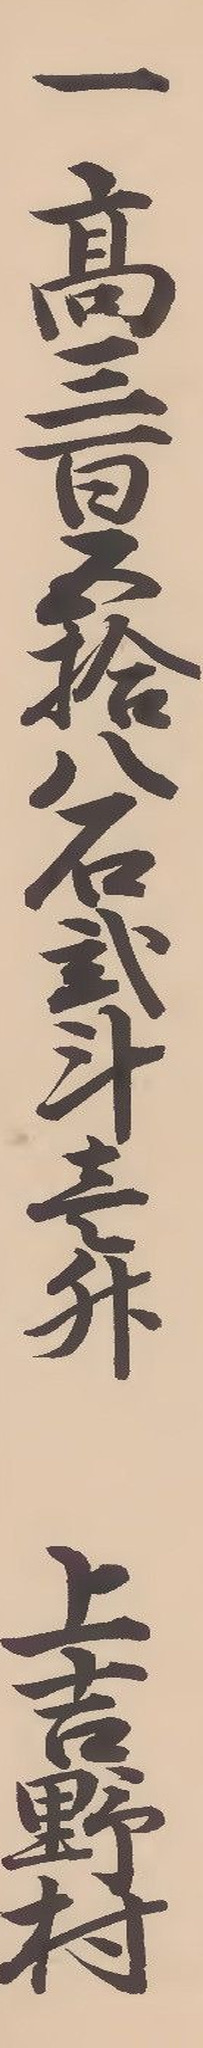一高三百五拾八石弐斗壱升上吉野村
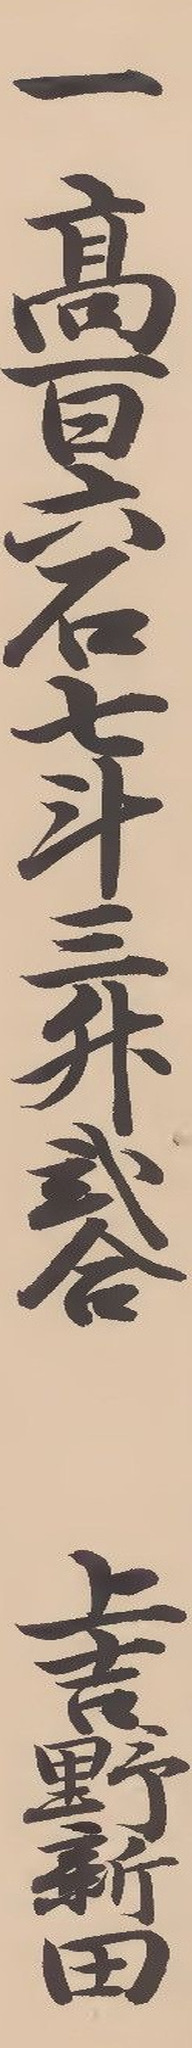一高百六石七斗三升弐合上吉野新田
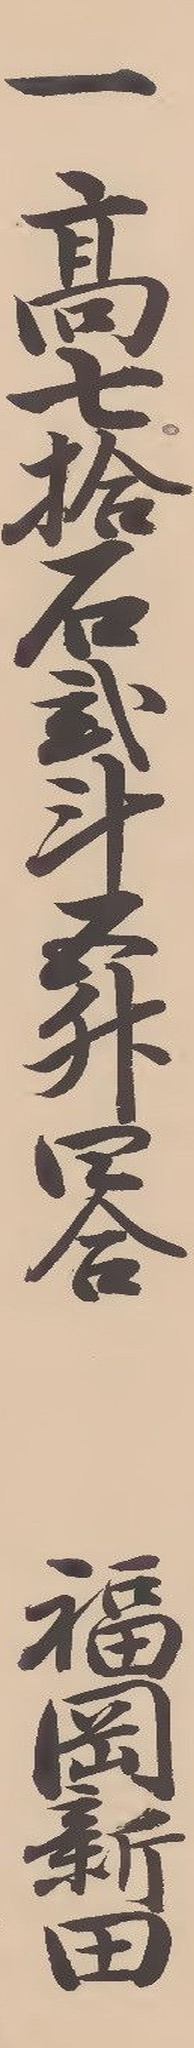一高七拾石弐斗五升四合福岡新田
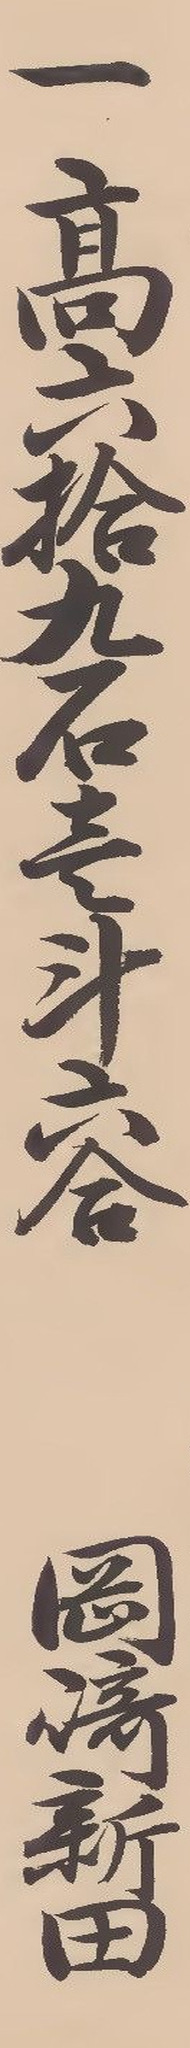一高六拾九石壱斗六合岡崎新田
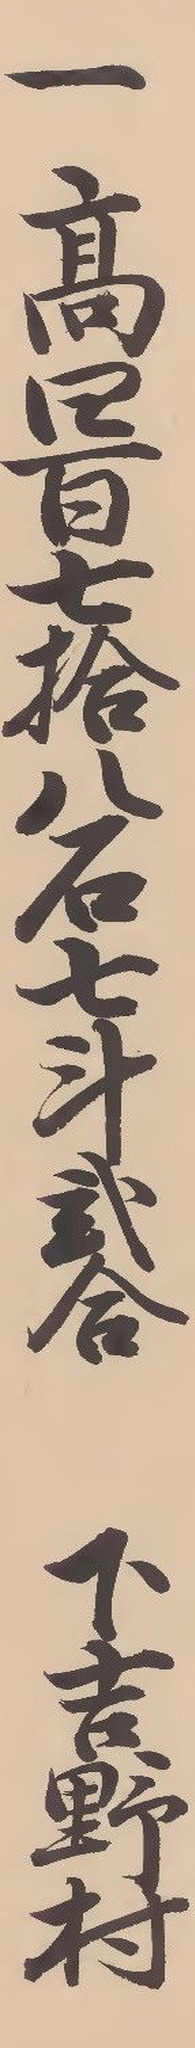一高四百七拾八石七斗弐合下吉野村

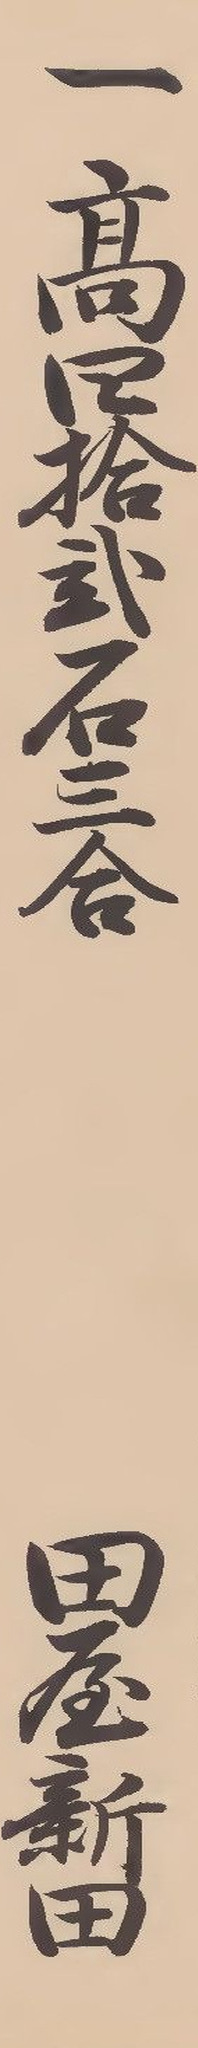一高四拾弐石三合田屋新田
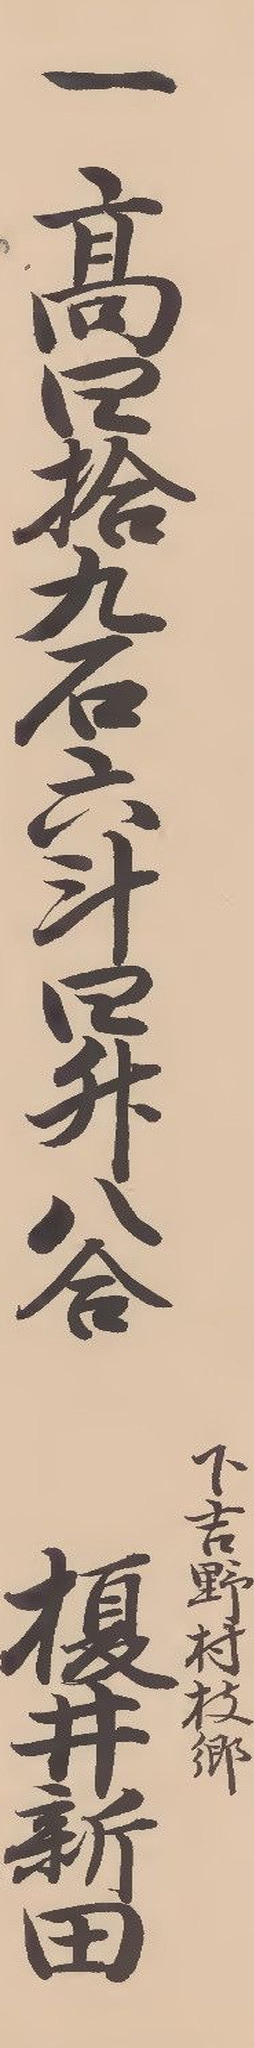一高四拾九石六斗四升八合榎井新田
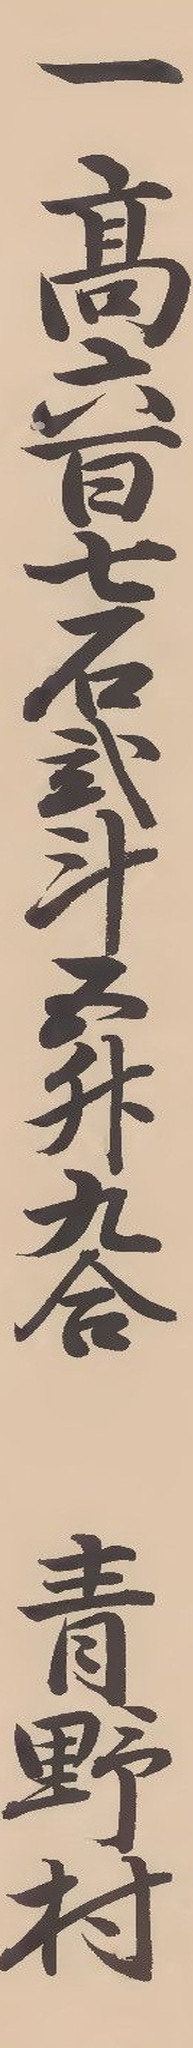一高六百七石弐斗五升九合青野村
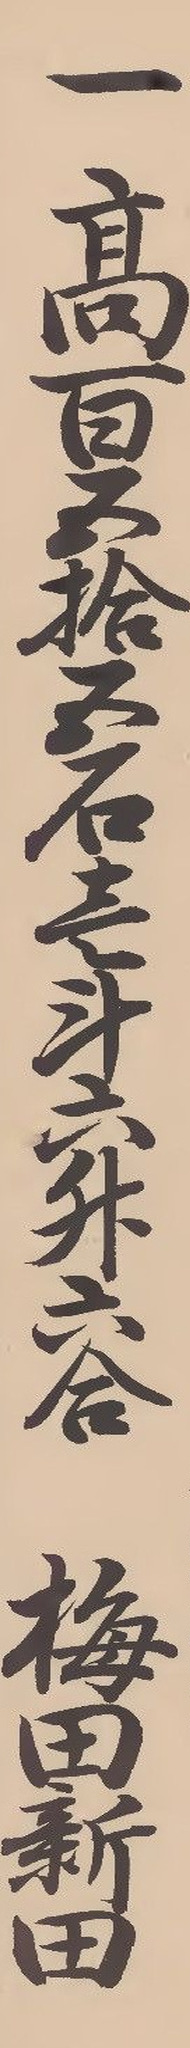一高百五拾五石壱斗六升六合梅田新田
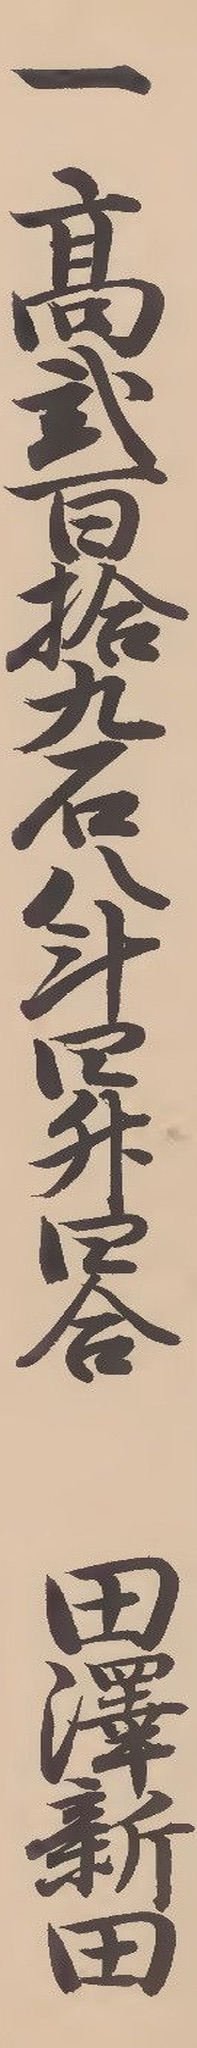一高弐百拾九石八斗四升四合田沢新田
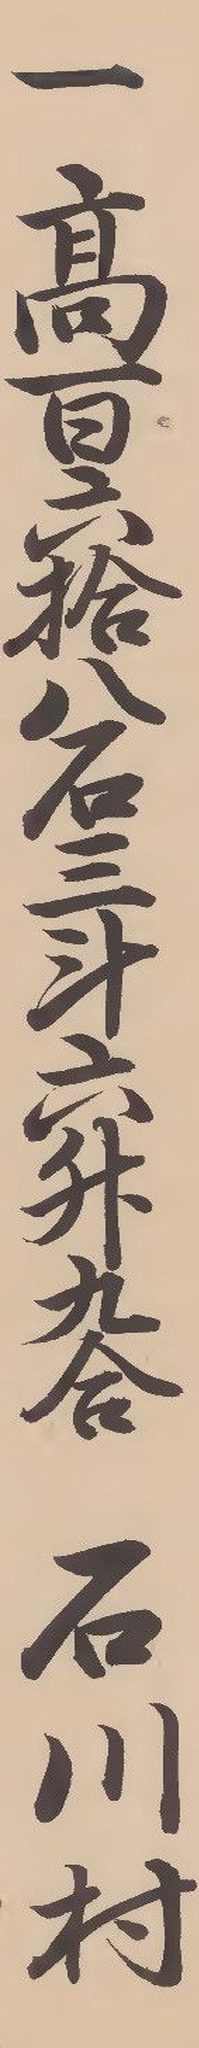一高百六拾八石三斗六升九合石川村
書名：越後国郷帳　上
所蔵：国立公文書館 National Archives of Japan
